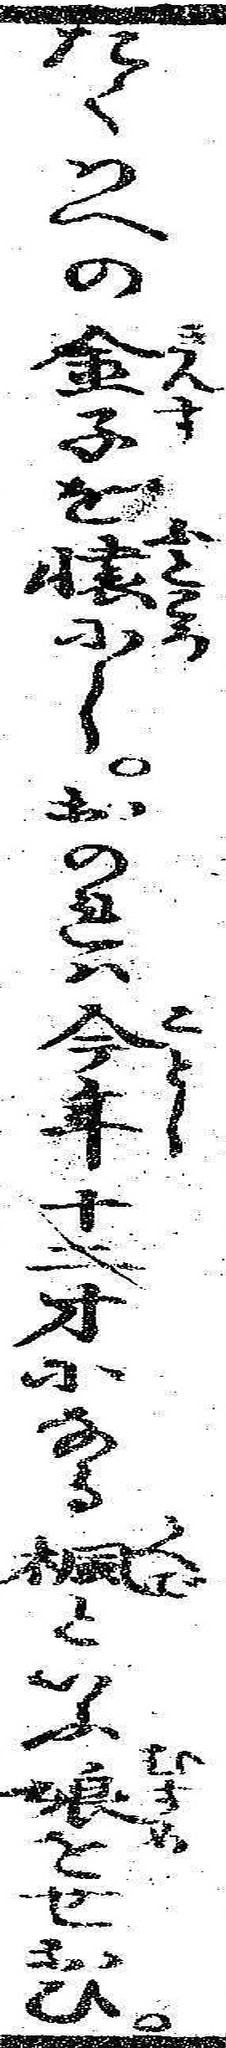たくはへの金子を懐にし。おのれは今年十二才になる楓といふ娘をせおひ。
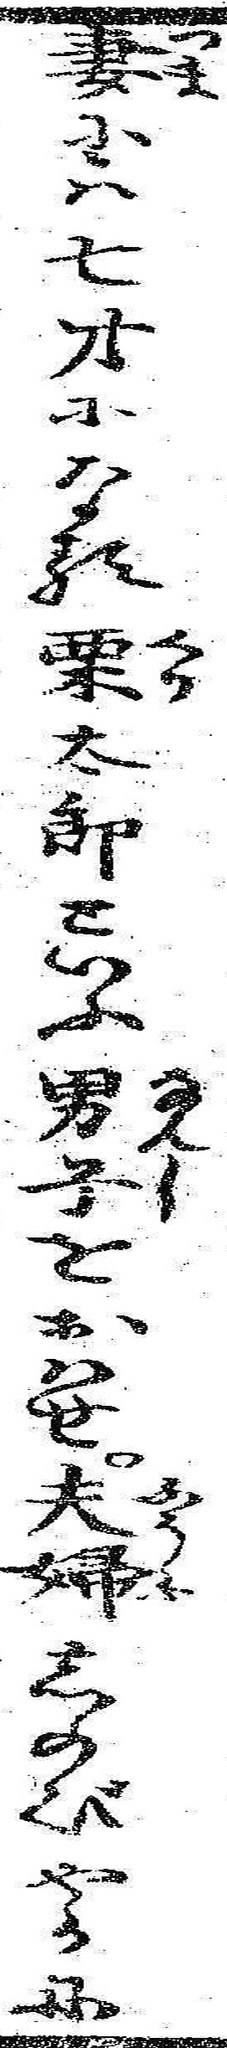妻には七才になる栗太郎といふ男子をおはせ。夫婦しのびやかに
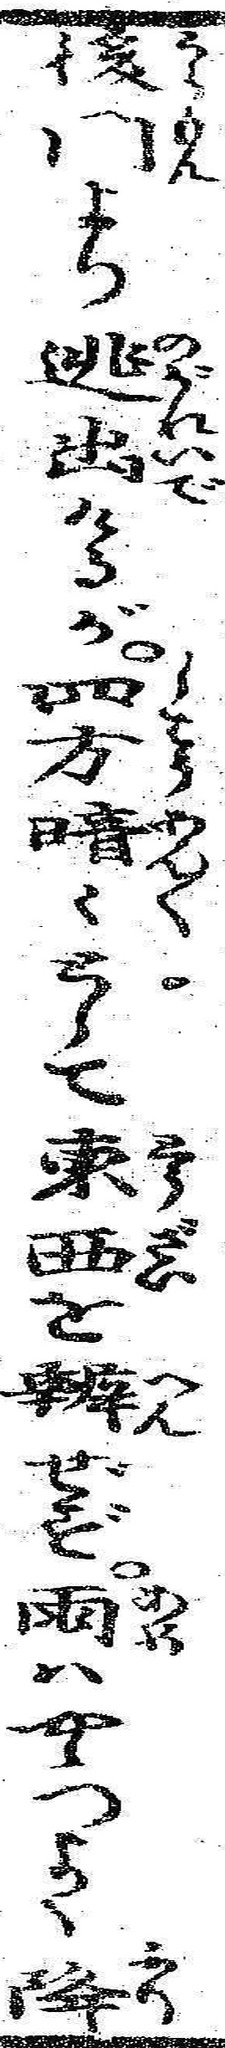後門より逃出けるが。四方暗々として東西を弁ぜず。雨はやゝつよく降
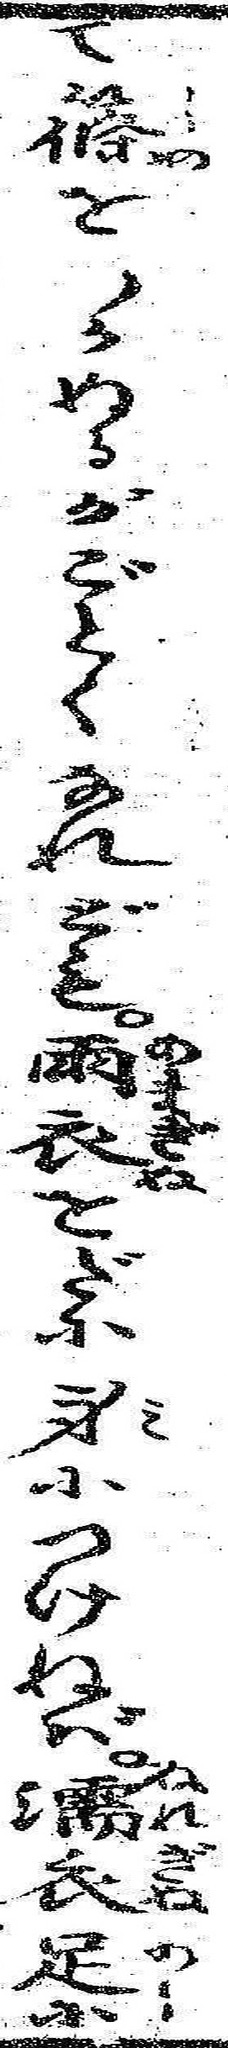て篠をつかぬるがごとくなれども。雨衣をだに身につけねば。濡衣足に
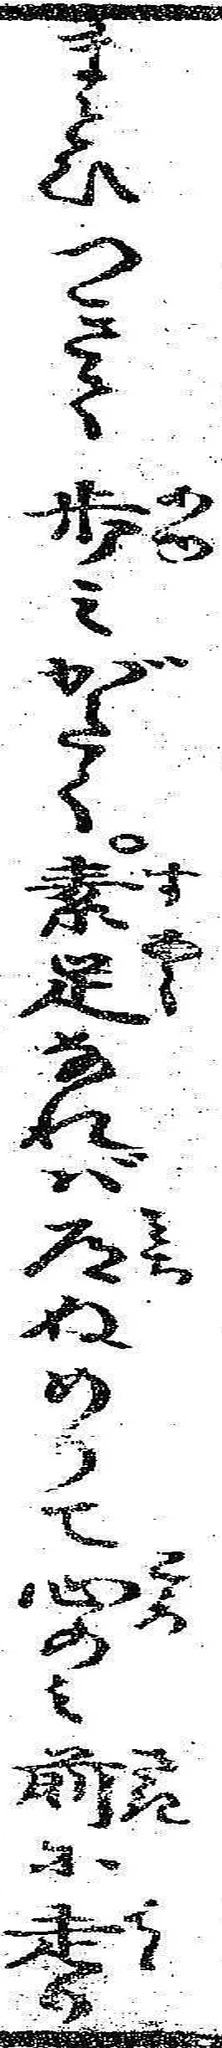まとひつきて歩みがたく。素足なれば道ぬめりて心のみ前に走り
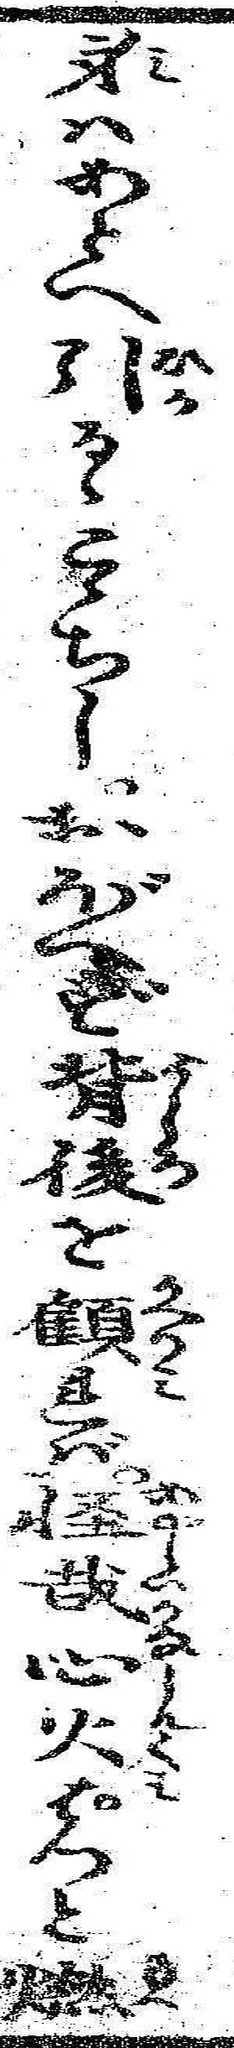身はあとへ引るゝこゝちし。おぼへず背後を顧れば。怪哉心火ぱつと燃
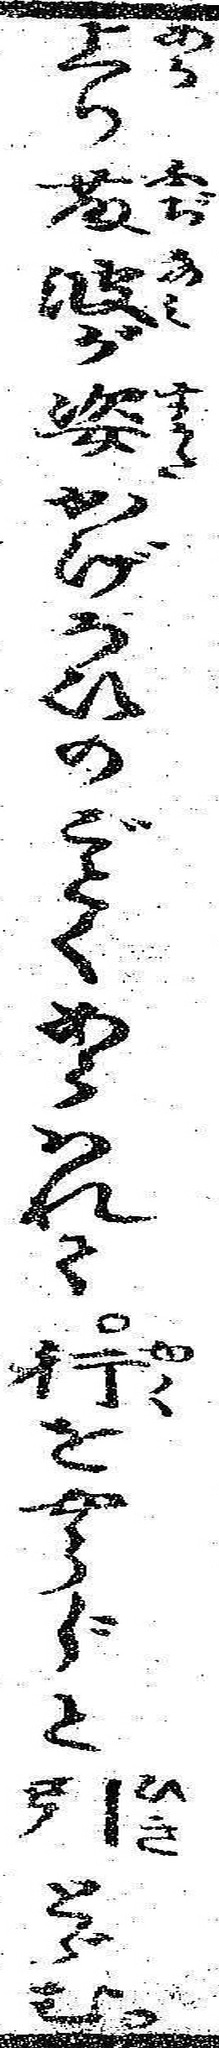上り藤波が姿かげろひのごとくあらはれて。行をやらじと引とゞむ。
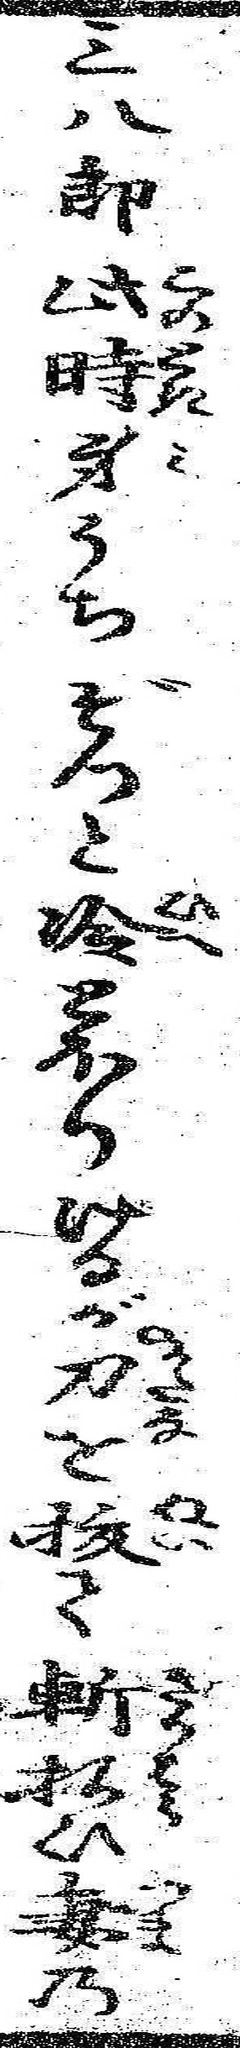三八郎此時身うちぞつと冷とほりけるが。刀を抜て斬払ひ妻の

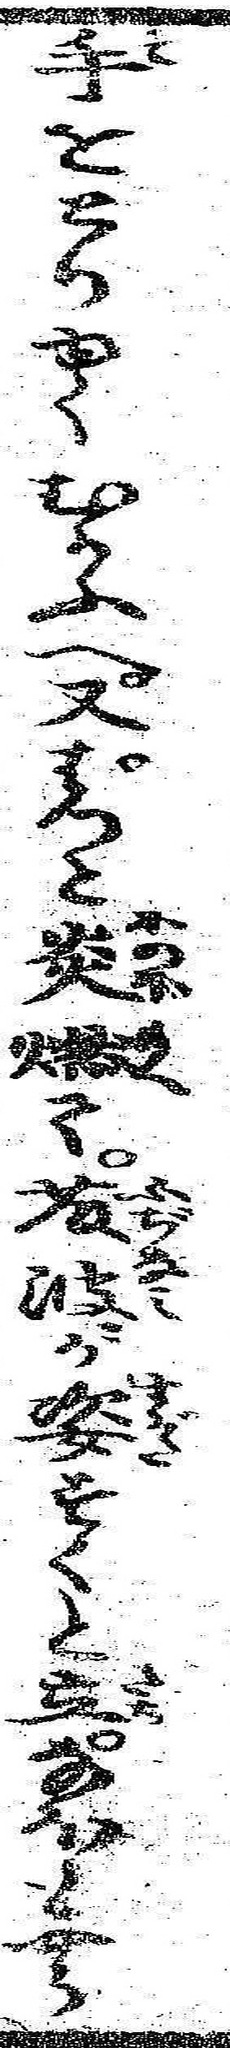手をとりゆくむかふへ。又ぱつと炎燃て。藤波が姿すくと立。なほもやら
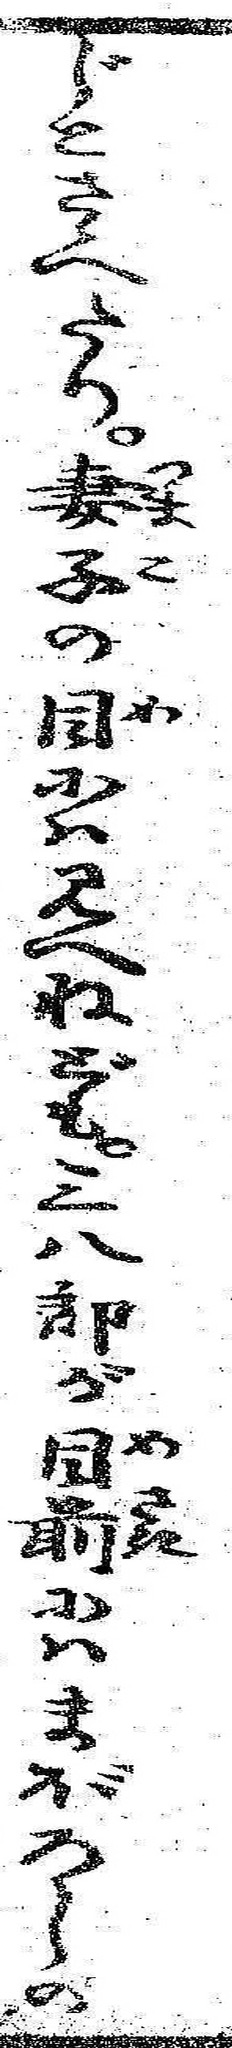じとさゝへたり。妻子の目には見へねども。三八郎が目前にはまぼろしの
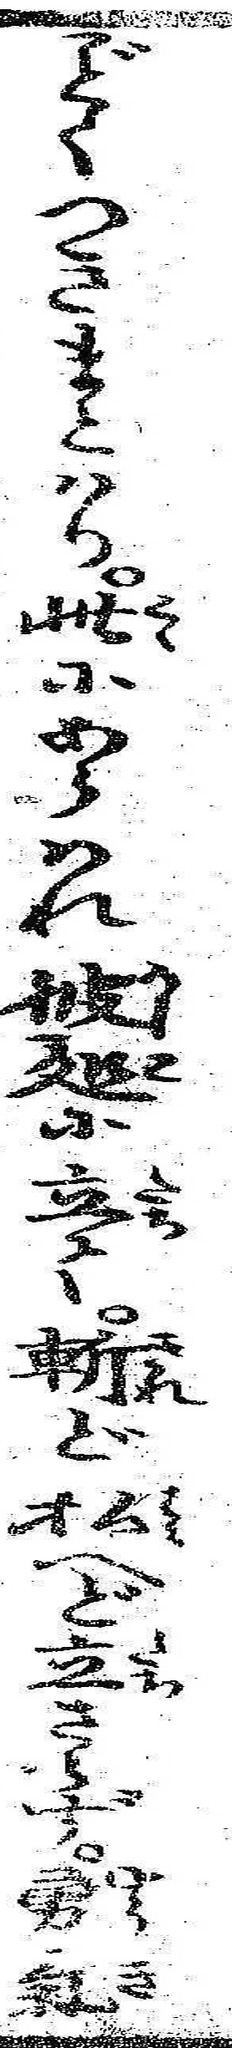ごとくつきまとはり。此にあらはれ彼処に立て。斬ど払へど立さらず。勇気
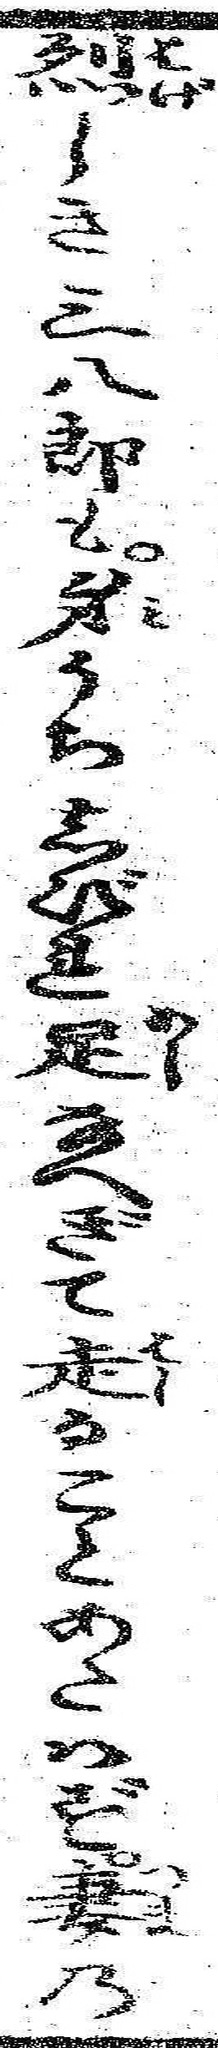烈しき三八郎も。身うちしびれ足なへぎて走ることあたはず。妻の
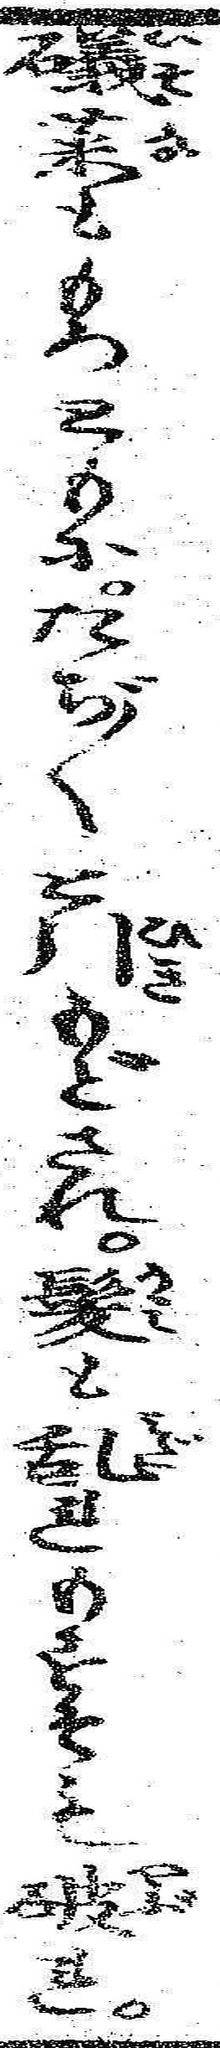礒莱ももろともに。たぢ〳〵と引もどされ。髪も乱れもすそも破れ。
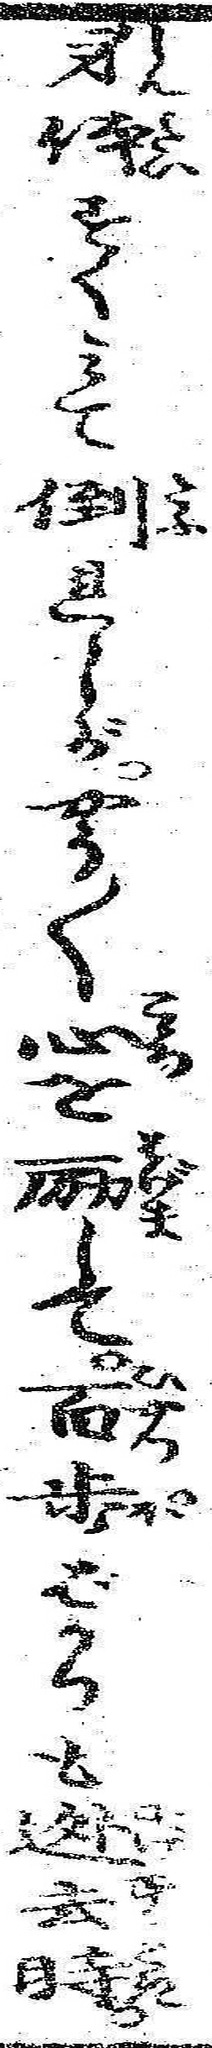身体すくみて倒れしが。やう〳〵心を励して。百歩ばかりも逃去時。
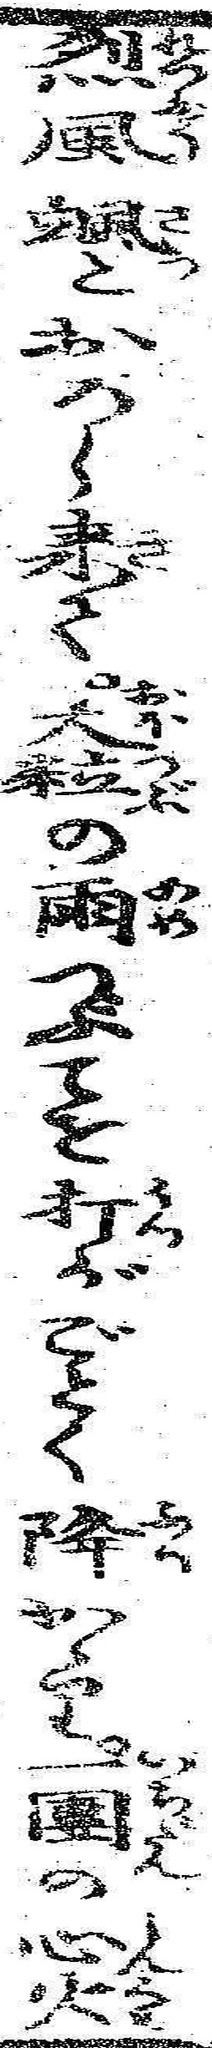烈風颯とおろし来て。大粒の雨つぶてを打がごとく降かゝり。一団の心火
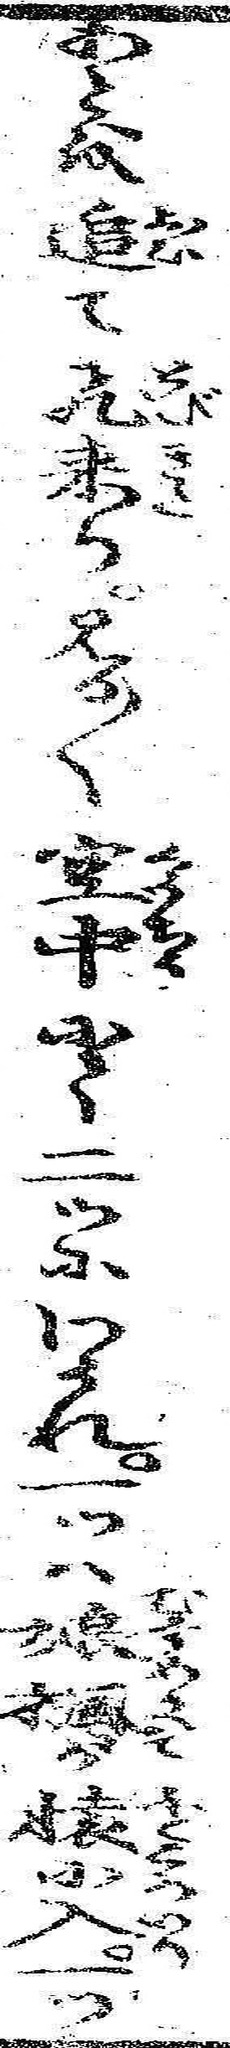あとを追て飛来り。見る〳〵空中にて二つにわかれ。一つは娘楓が懐に入。一つ
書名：昔話稲妻表紙
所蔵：国文学研究資料館
